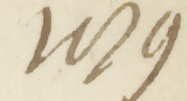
189
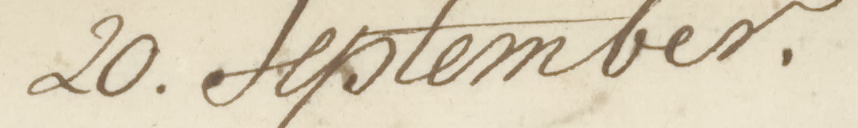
20. September.
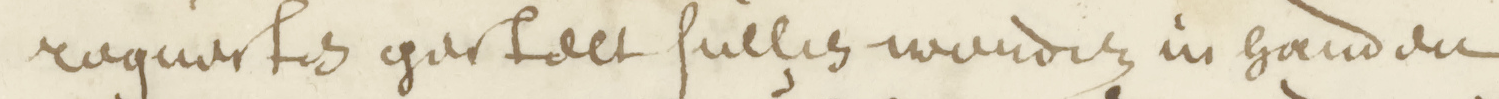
requesten gestelt sullen werden in handen
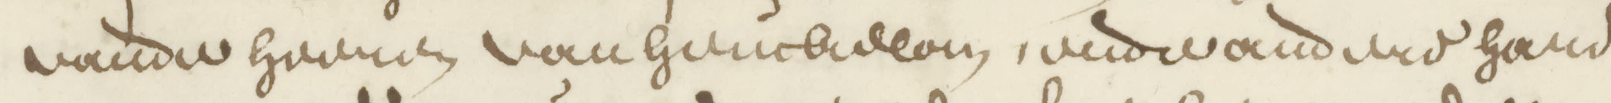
vande heeren van heuckelom, ende andere hare
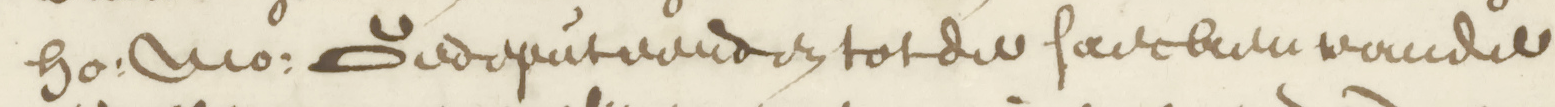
ho:mo: Gedeputeerden tot de saecken vande
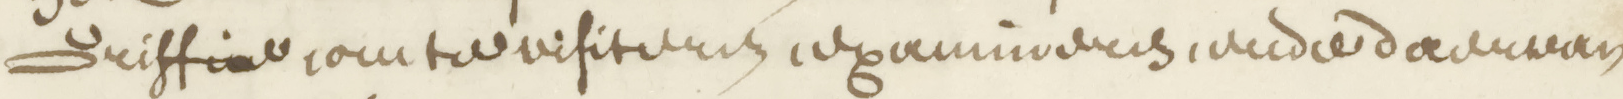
Griffie, om te visiteren, examineren, ende daervan
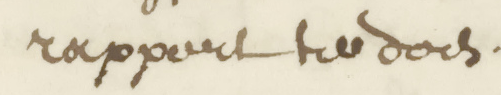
rapport te doen.
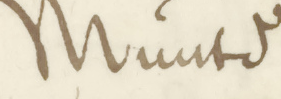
Munte
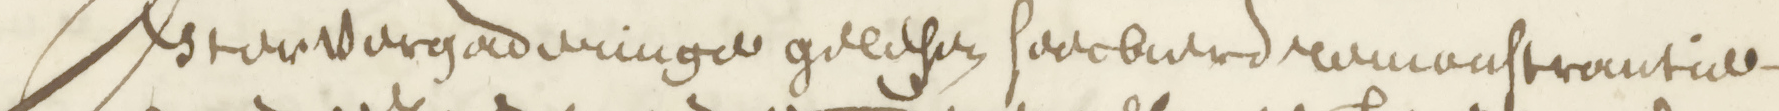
Is ter vergaderinge gelesen seeckere remonstrantie
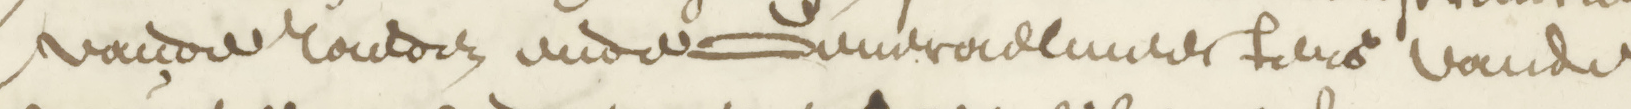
vande Raeden ende Generaelmeesters vande
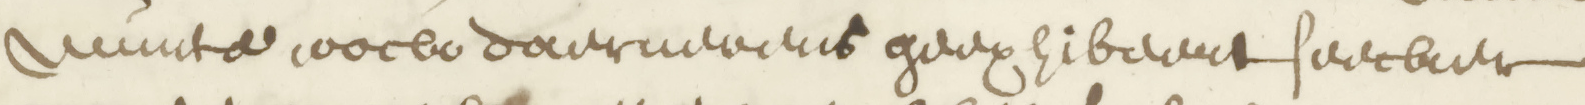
munte, oock daernevens geexhibeert seecker
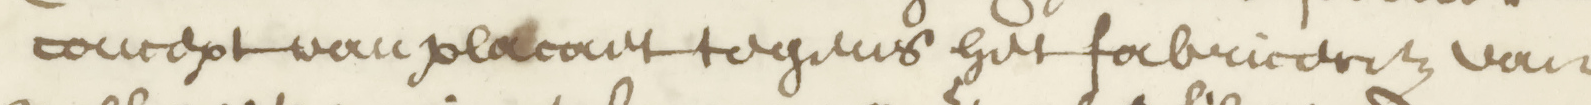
concept van placaet tegens het fabriceren van
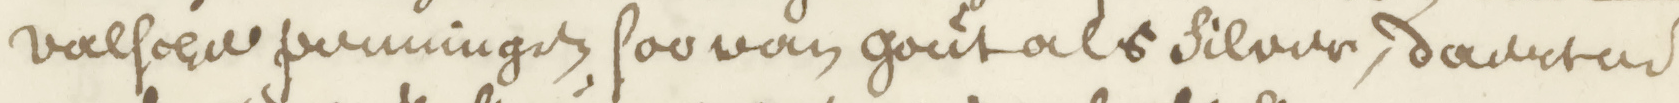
valsche penningen soo van gout als silver, daertoe
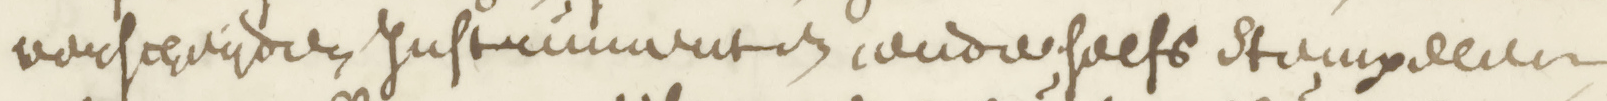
verscheijden Instrumenten, ende selfs stempelen
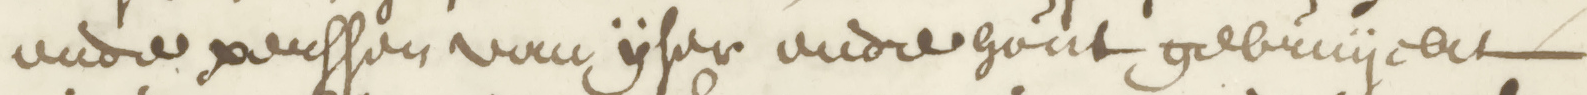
ende perssen van ijser ende hout gebruijckt
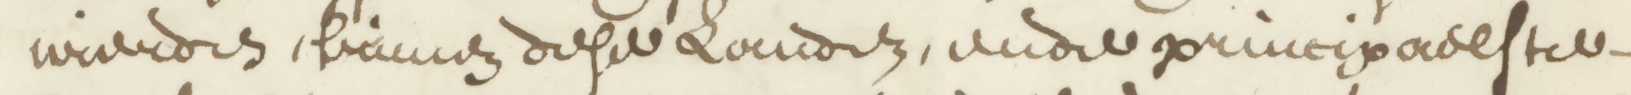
werden, binnen dese Landen, ende principaelste
